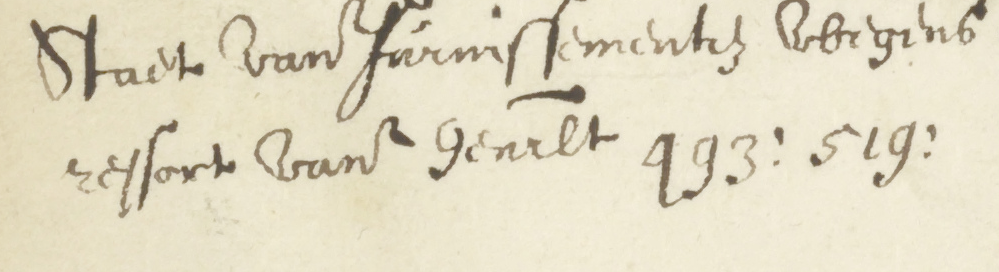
ressort van Genrlt 493: 519:
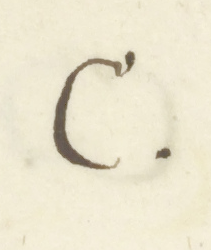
C.
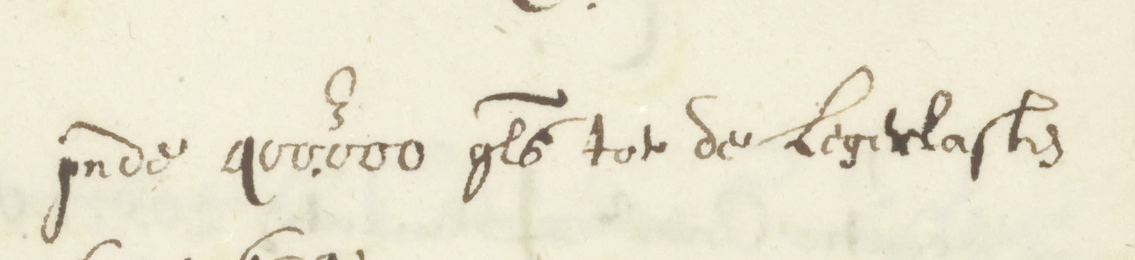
inde 400.000 gls tot de Legerlasten
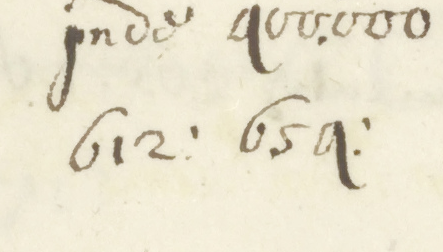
612: 654:
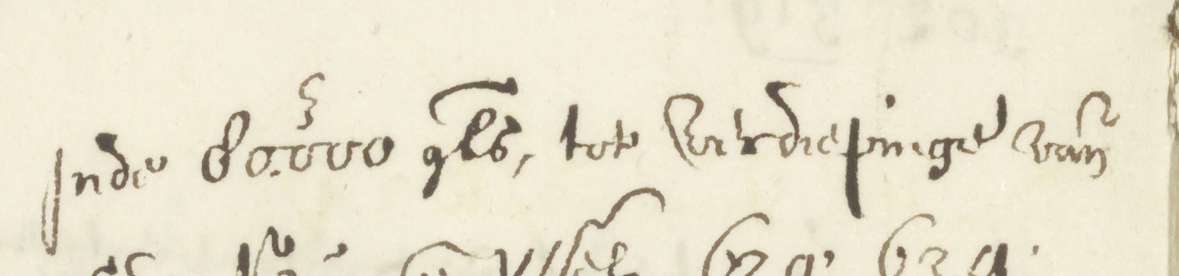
inde 80.000 gls, tot verdiepinge van
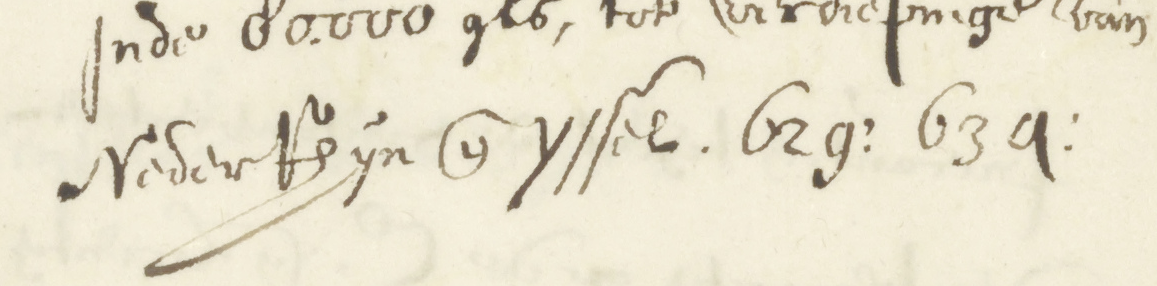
NederRhijn & Yssel. 629: 634:
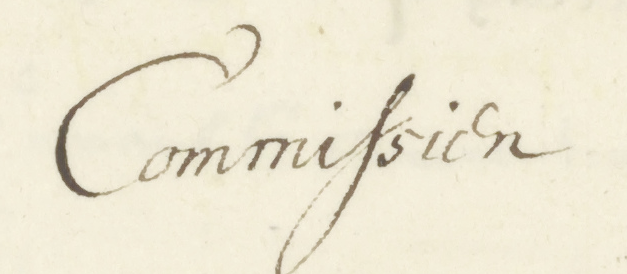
Commissien
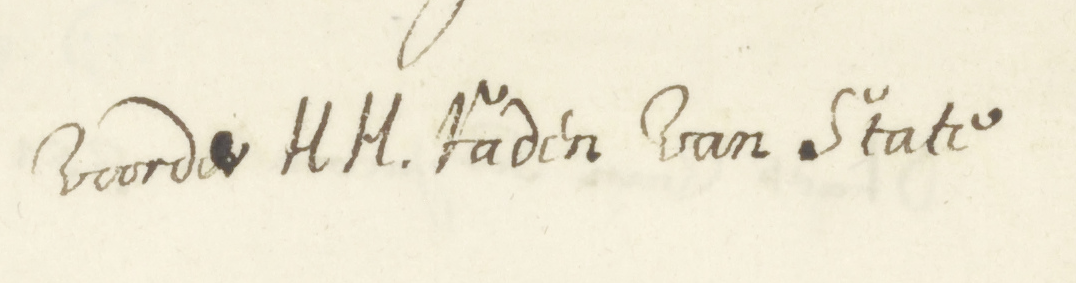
voorde H.H. Raden van State
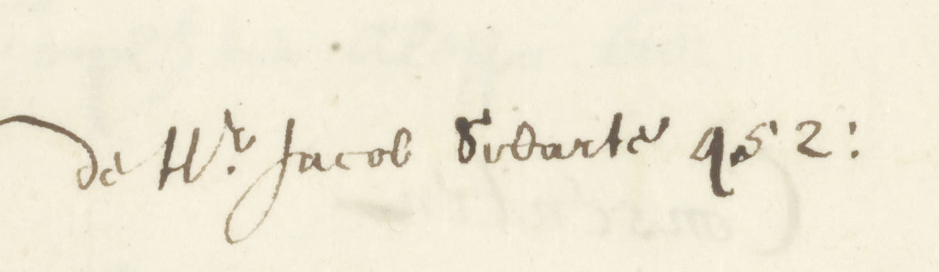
de Hr. Jacob Swarte 452:
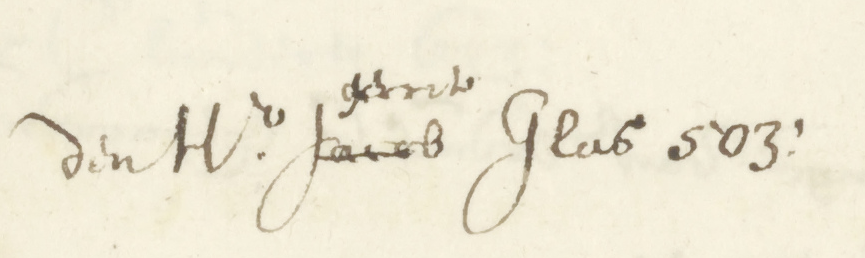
den Hr. JacobGerrit Glas 503:
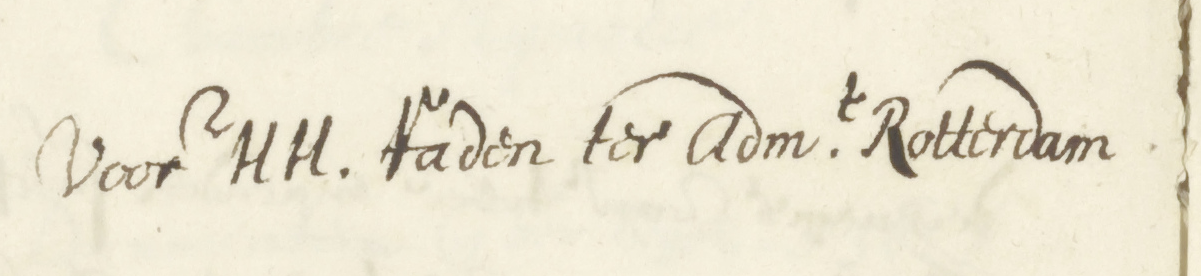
Voor H.H. Raden ter Admt. Rotterdam.
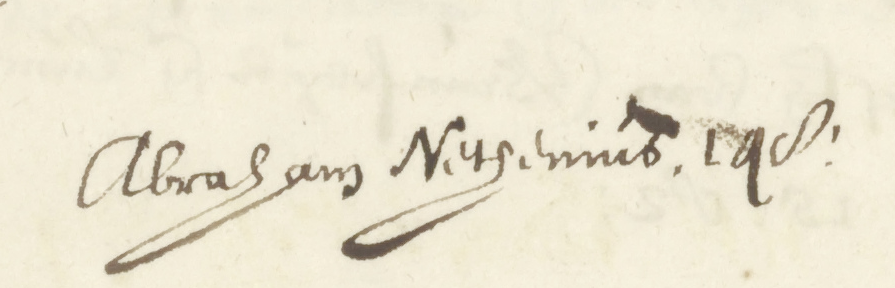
Abraham Nethenius 148:
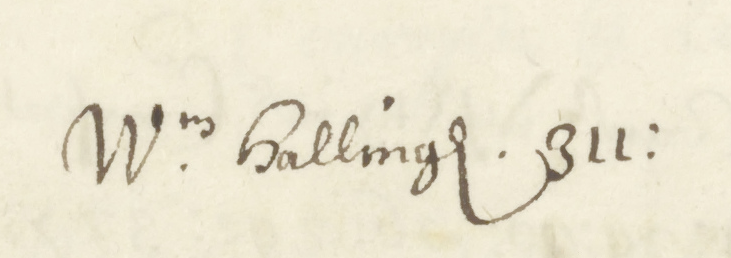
Wm. Hallingh. 311:
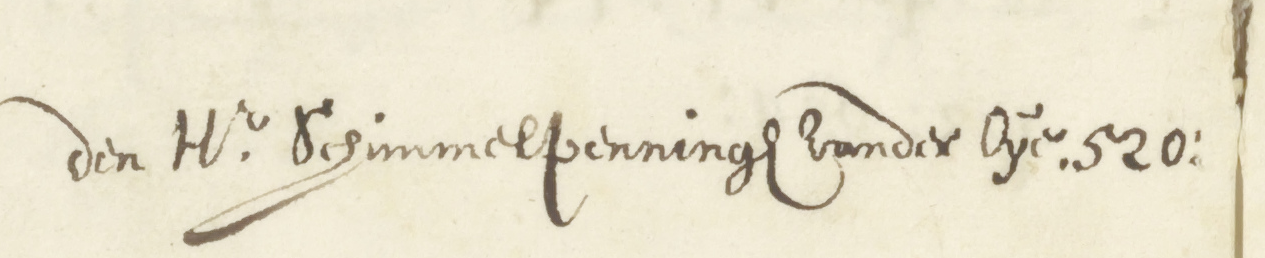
den Hr. Schimmelpenningh vander Oije. 520:
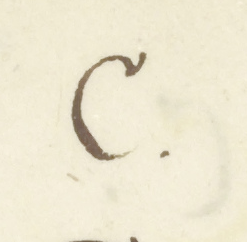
C.
